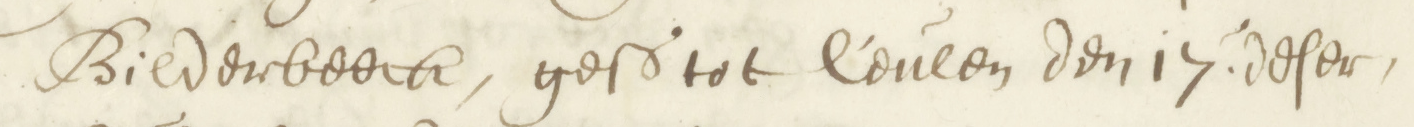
Bilderbeeck, gess. tot Ceulen den 17e. deser,
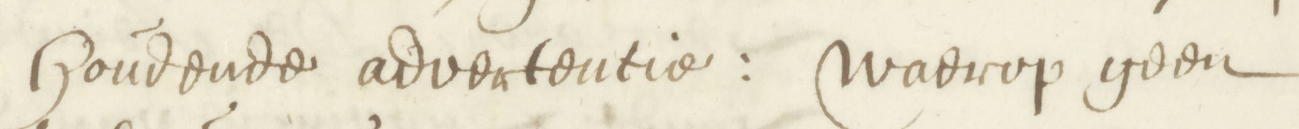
houdende advertentie: Waerop geen
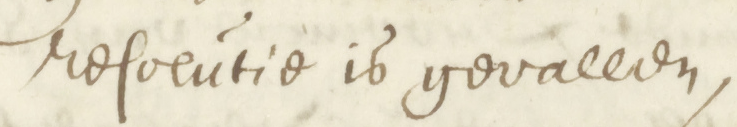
resolutie is gevallen.
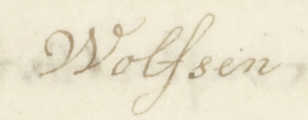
Wolfsen
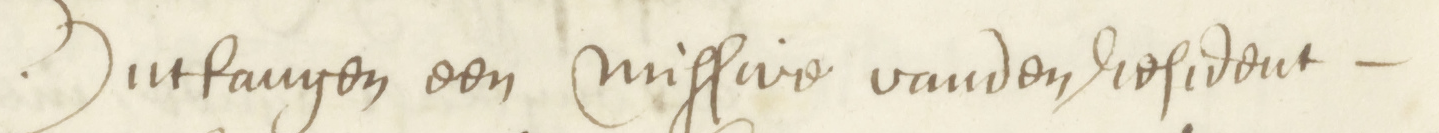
Ontfangen een missive vanden resident -
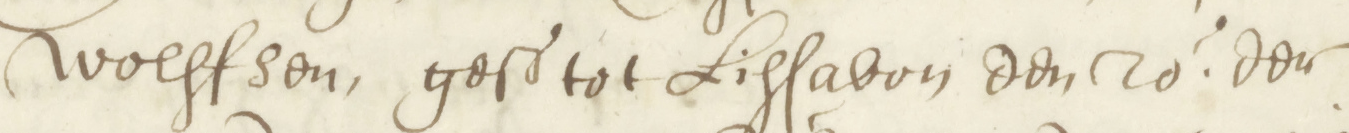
wolffsen, gess. tot Lissabon den 20e. der
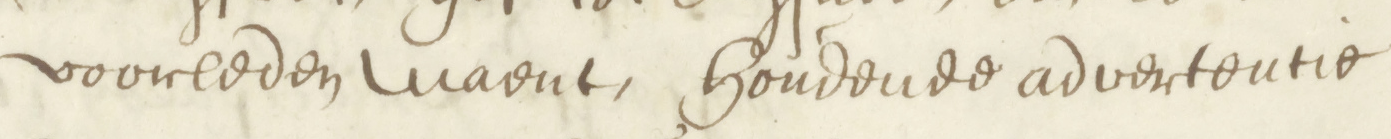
voorleden maent, houdende advertentie
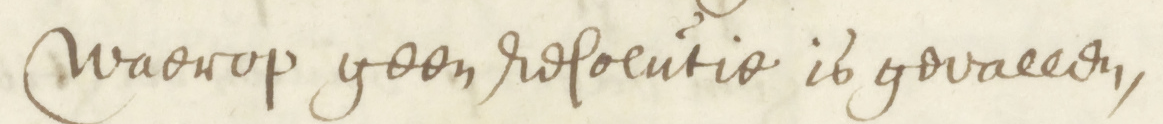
Waerop geen resolutie is gevallen.
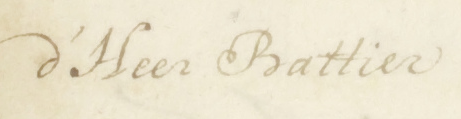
d'Heer Battier
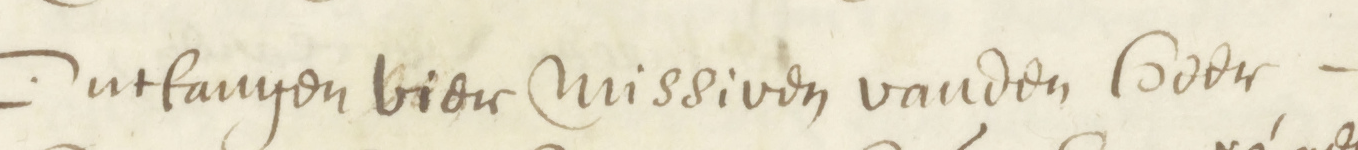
Ontfangen vier missiven vanden heer -
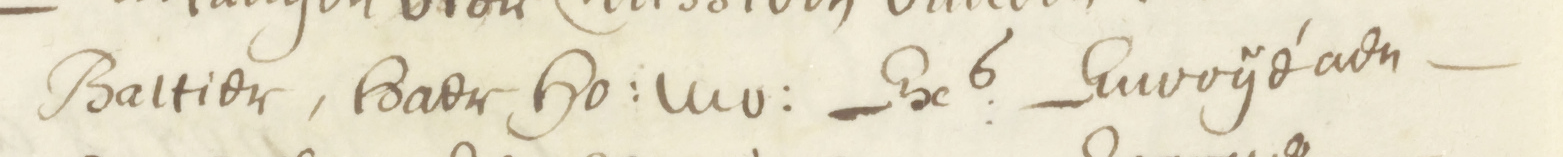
Battier, haer ho:mo Exs. Envoijé aen —
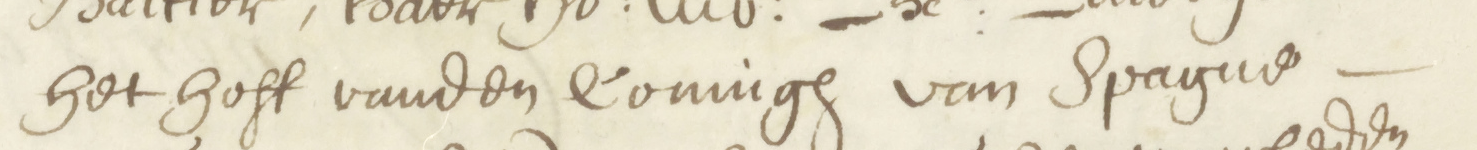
het hoff vanden Coningh van Spagne —
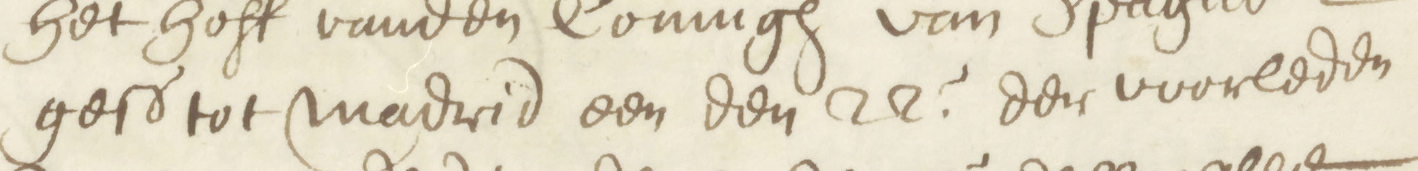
gess. tot madrid een den 22e. der voorleden
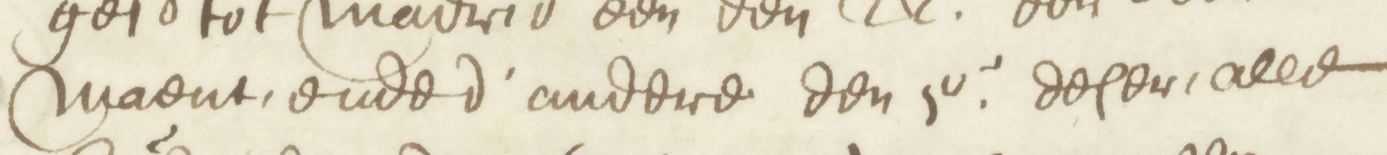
maent, ende d'andere den 10e. deser, alle
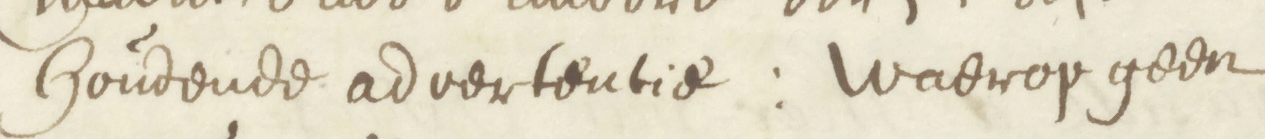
houdende advertentie: Waerop geen
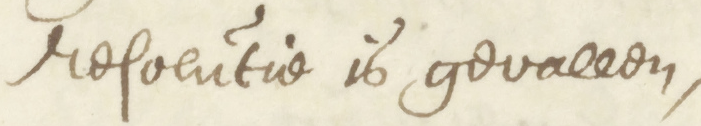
resolutie is gevallen.
